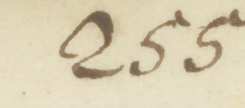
255
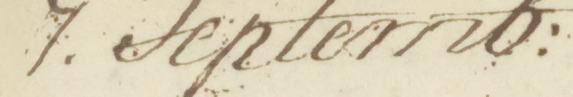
7. Septemb:
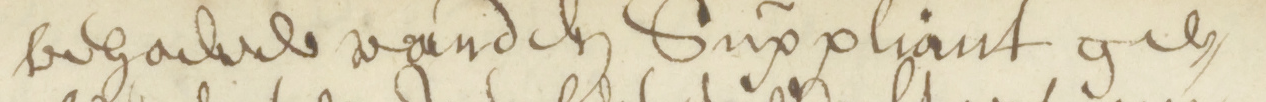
behoeve vanden Suppliant ge,,
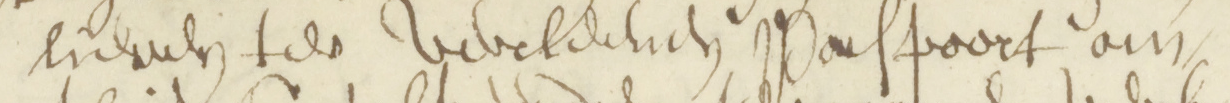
lieven te verleenen paspoort om,
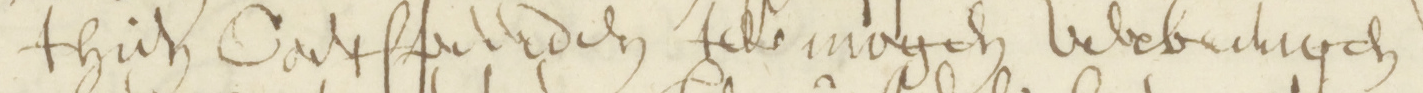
thien Coetspeerden te mogen verbrengen
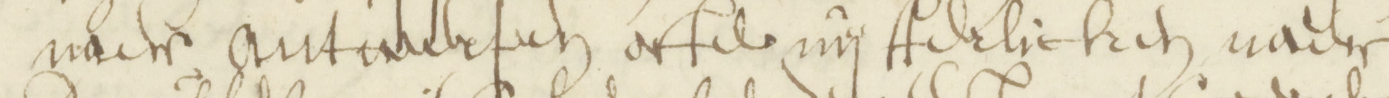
naer Antwerpen ofte uijtterlicken naer
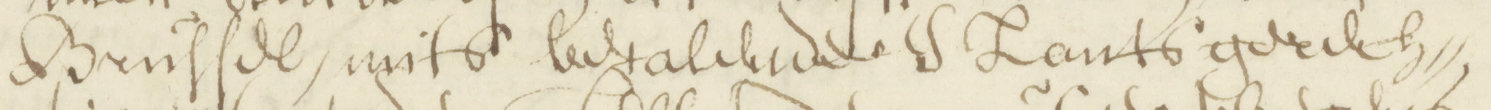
Brussel, mits betalende 's Lants gerech,,
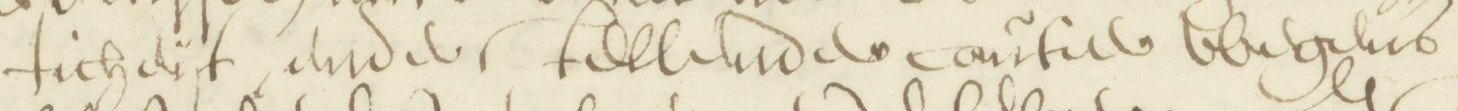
ticheijt, ende stellende cautie wegens
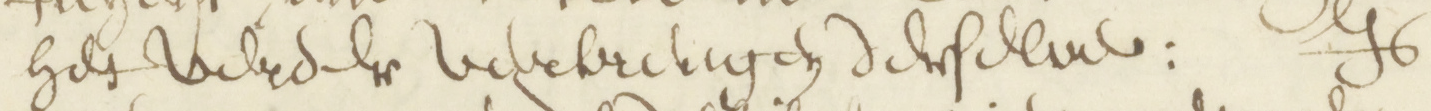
het verder verbrengen derselve: Is
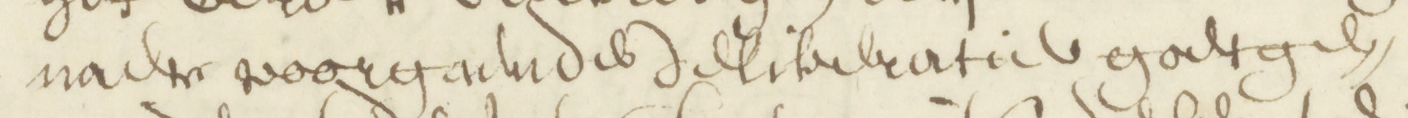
naer voorgaende deliberatie goetge,,
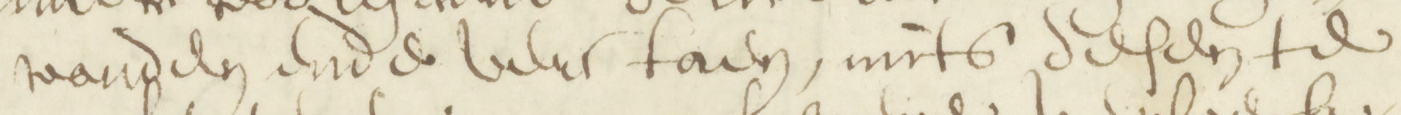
vonden ende verstaen, mits desen te
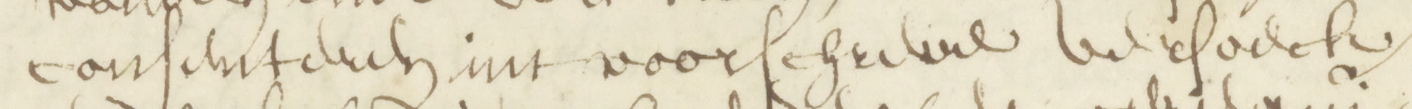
consenteren int voorschreve versoeck
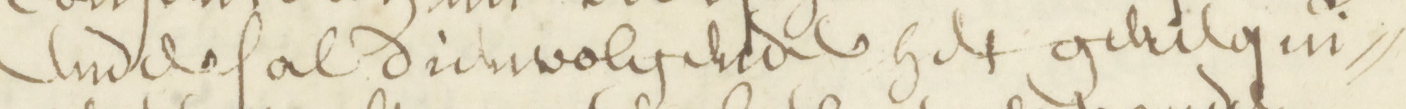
ende sal dienvolgende het gerequi,,
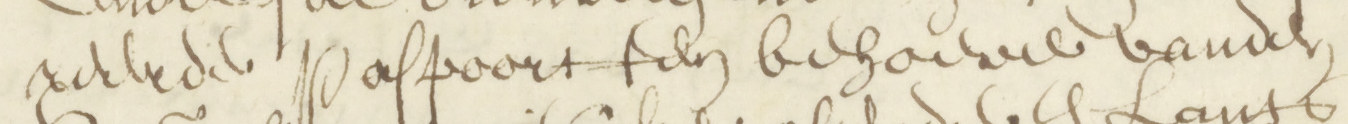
reerde Paspoort ten behoeve vanden
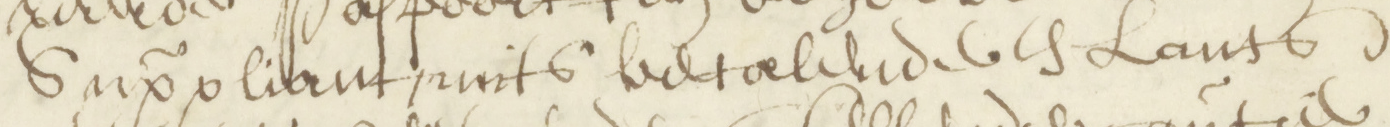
Suppliant, mits betalende 's Lants
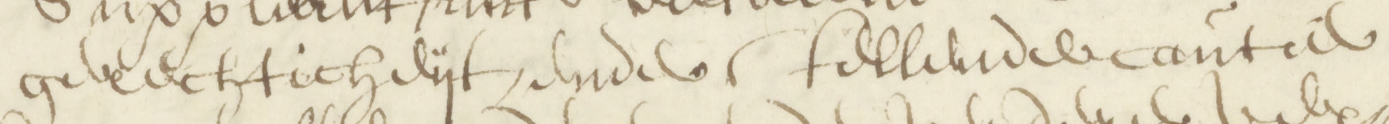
gerechticheijt, ende stellende cautie
